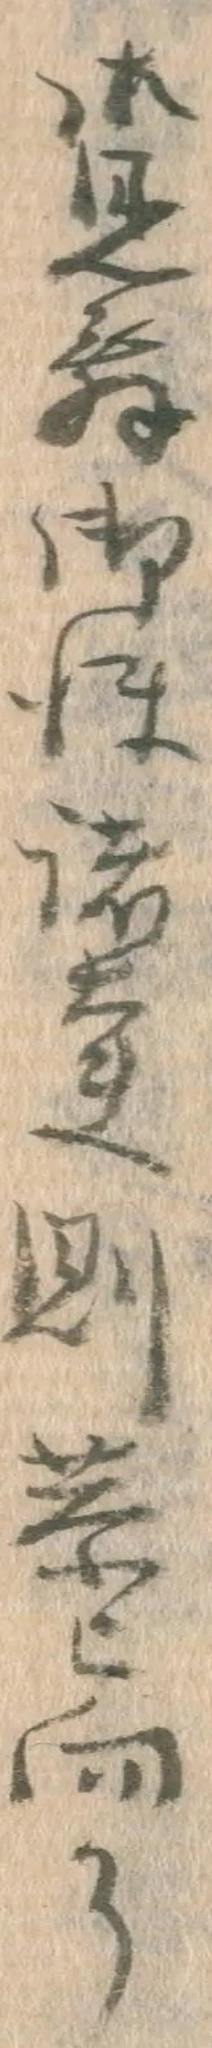御見舞御使、諸大夫則茶被向了、
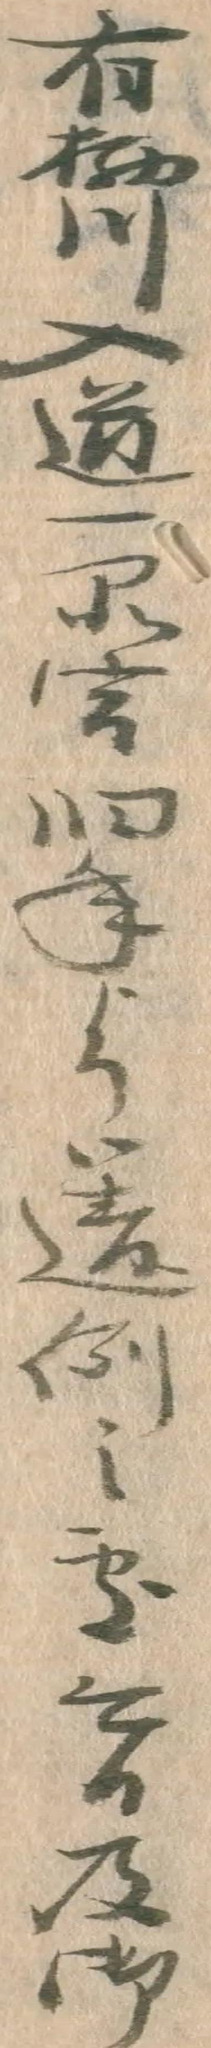有栖川入道一品宮、旧年よりハ違例之處、今日及御
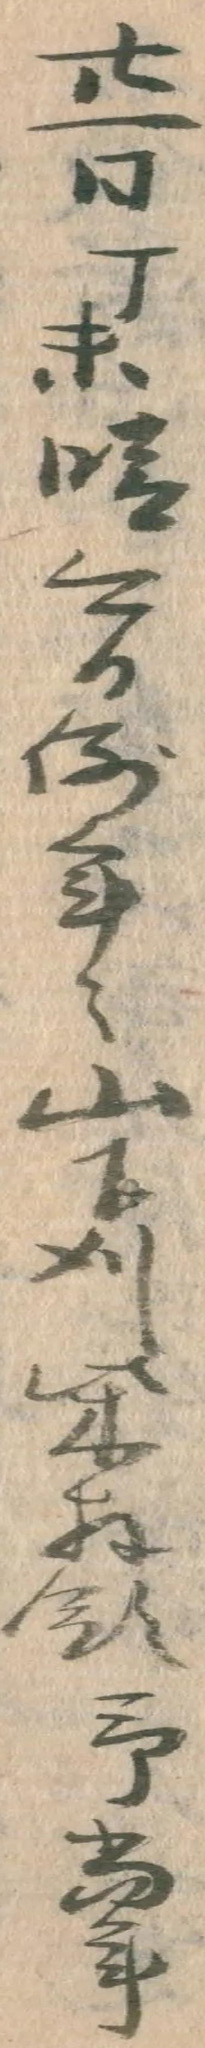廿一日丁未晴、今日例年之山下刈柴拝領、予當年
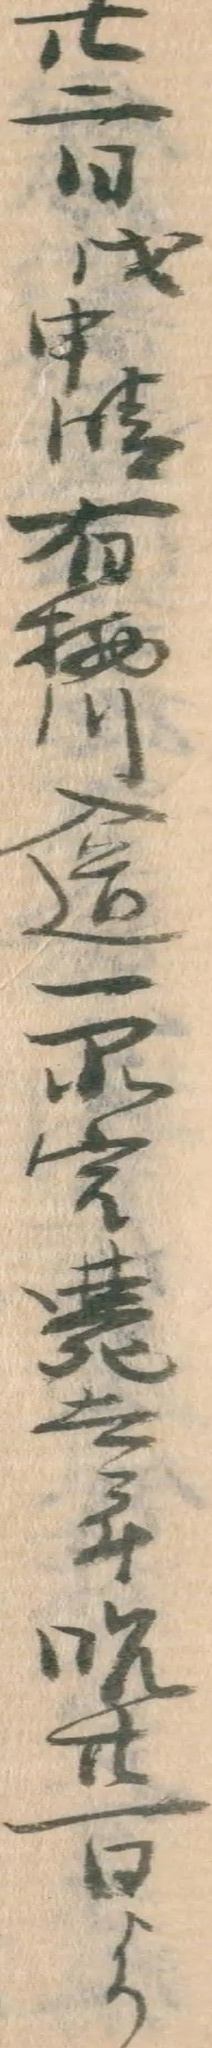廿二日戊申晴、有栖川入道一品宮薨去ニ付、昨廿一日より
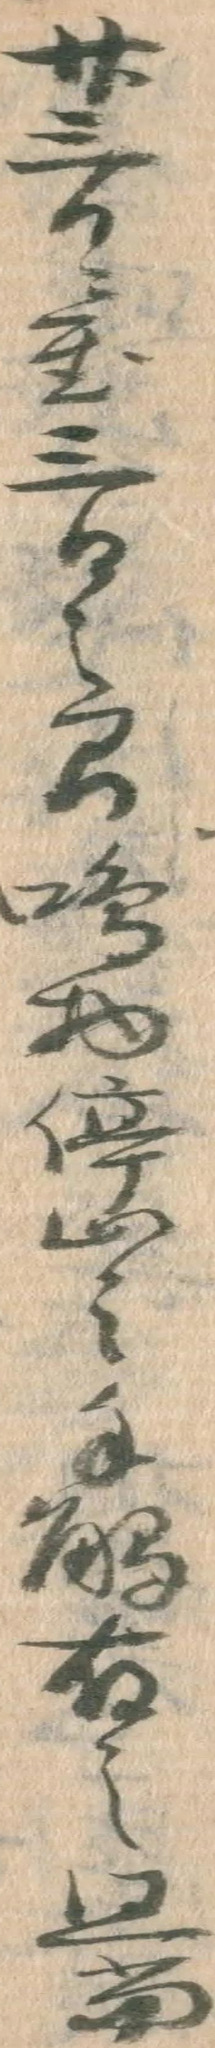廿三日ニ至、三日之間鳴物停止之手触有之、且當
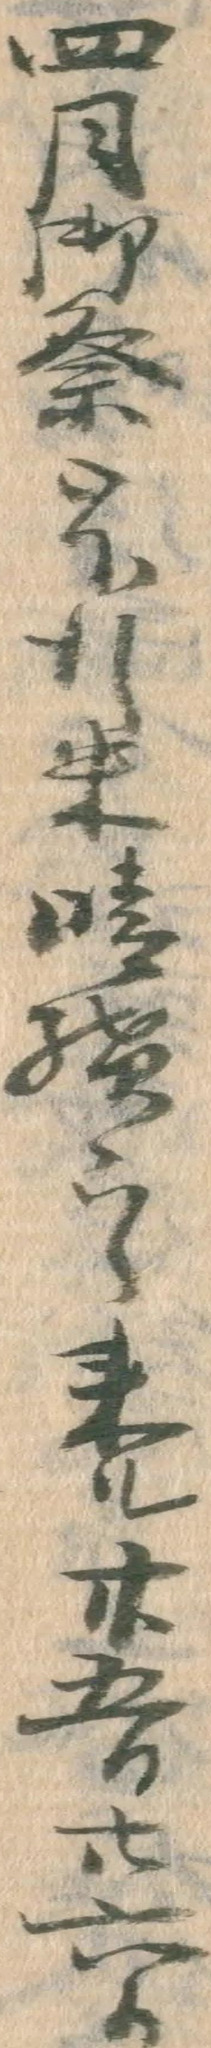四月御祭御引米晴続候ハヽ、来ル廿五日・廿六日
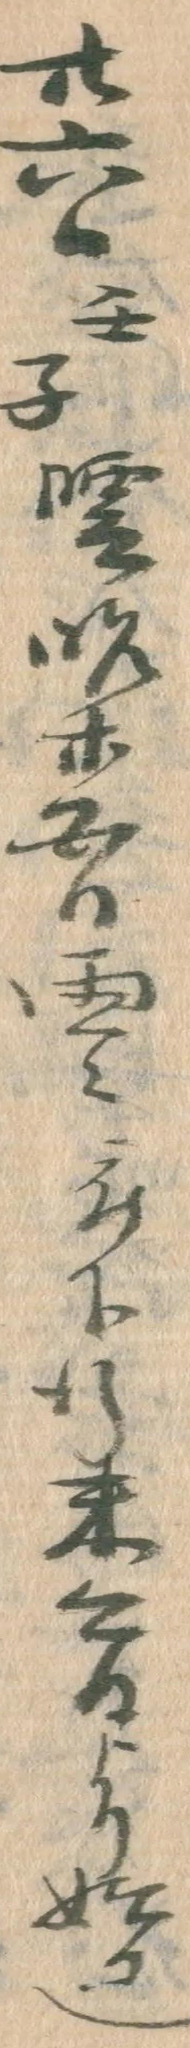廿六日壬子雲、昨廿五日雨候ニ付、下行来今日より始る也、
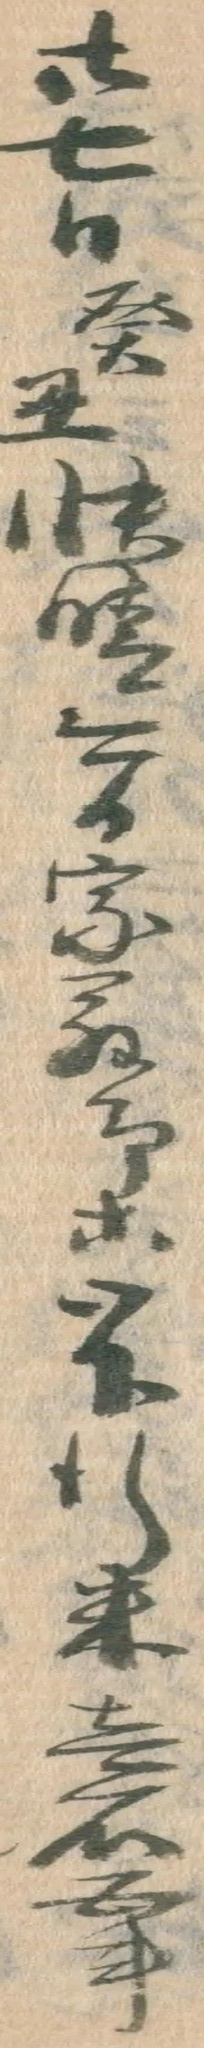廿七日癸丑快晴、今日家予御下行米壱石五斗
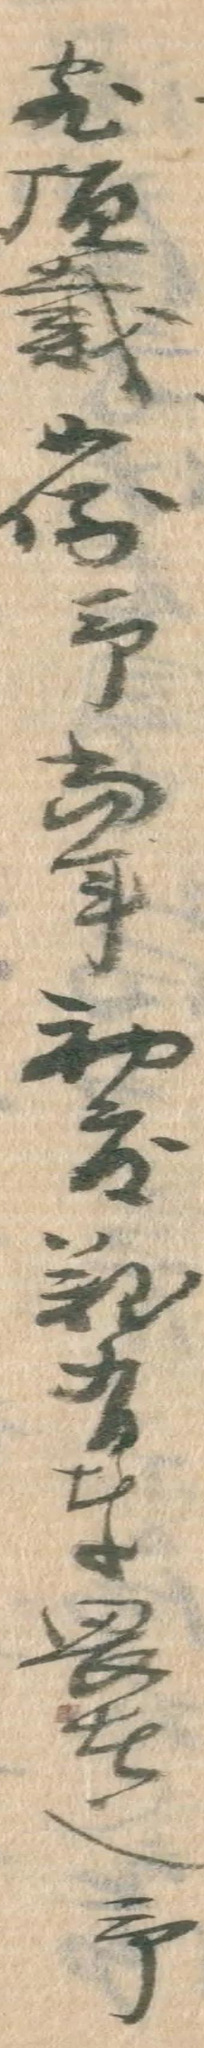宛頂戴如例、予當年初度難有奉畏者也、予
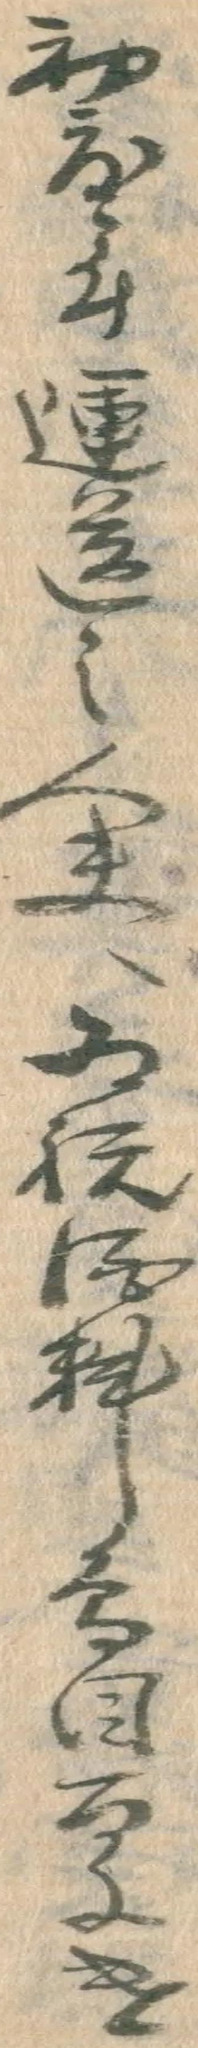初度に付運送之人夫へ為祝酒料、鳥目百文遣
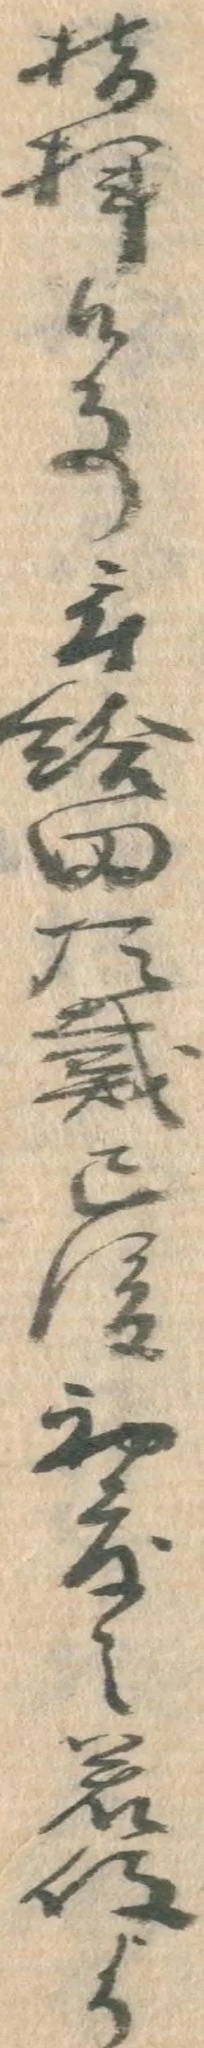指揮候事ニ付、給田頂戴已後、初度之若役より
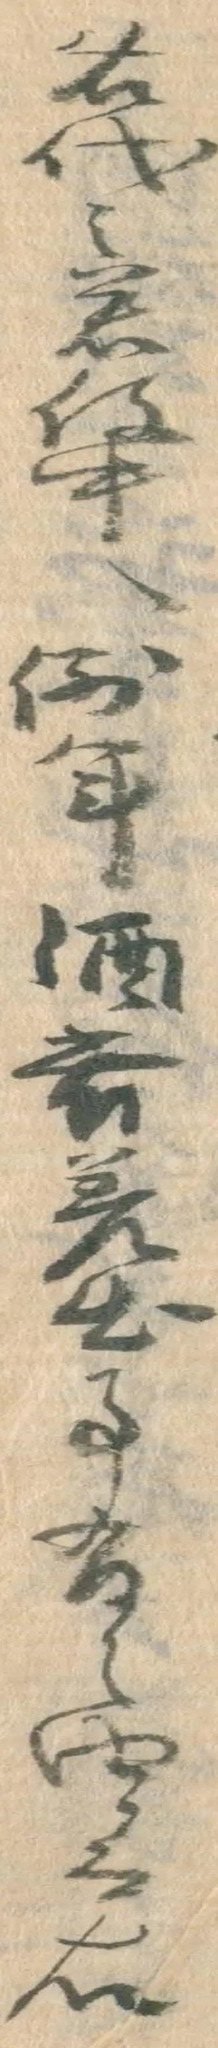名代之若役中へ例年酒肴差出事有之由二而、右

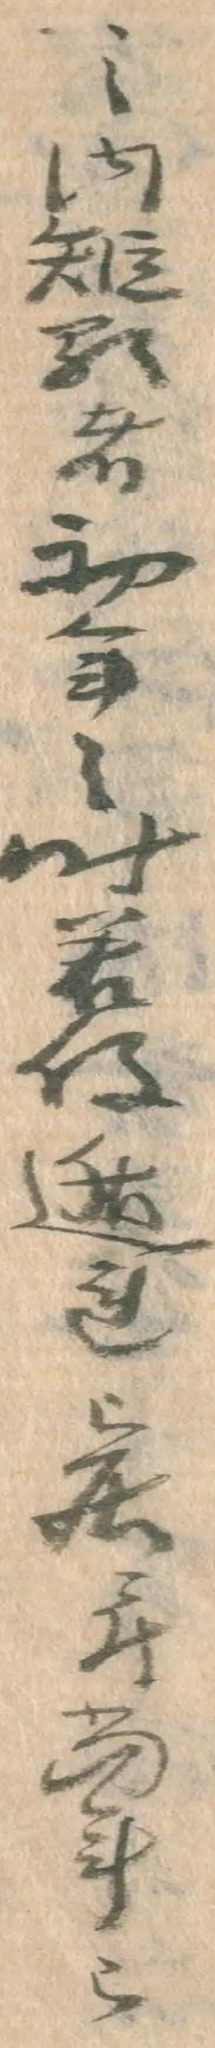之内、矩顕者初年之時若役遁れ被居ニ付、當年被
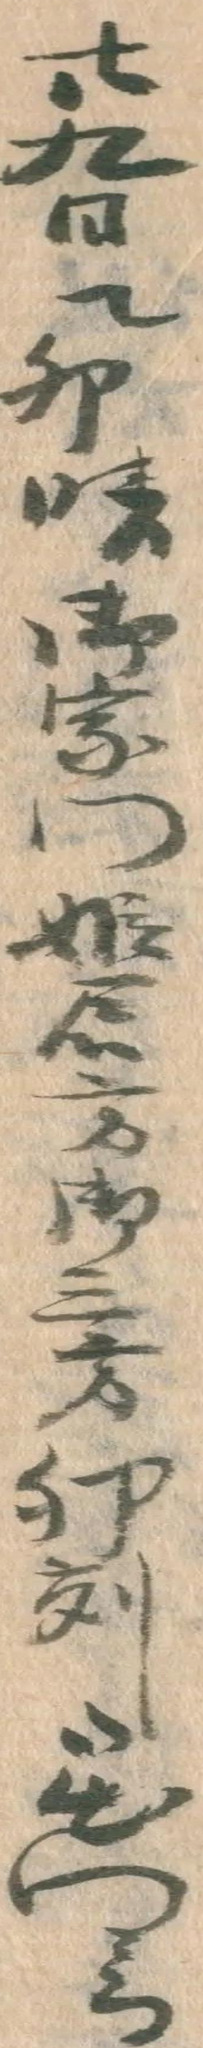廿九日乙卯晴、御家門姫君方御三方、卯刻御出門ニ而
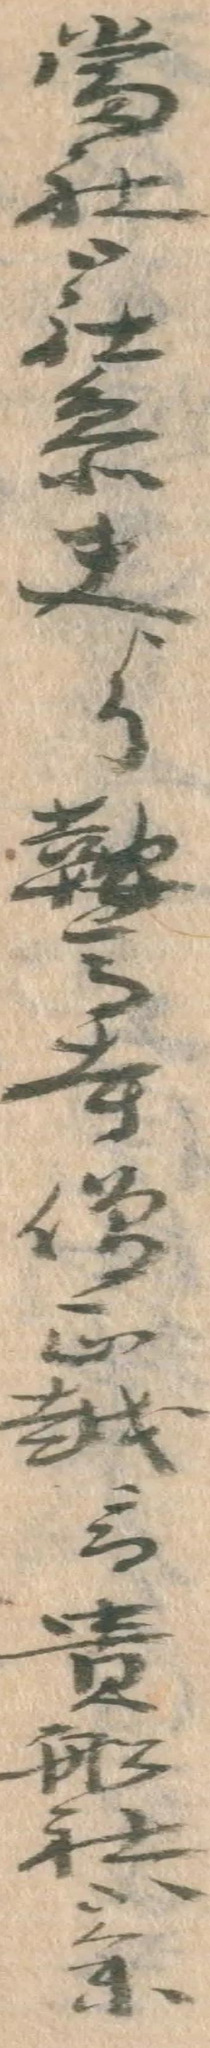當社御社参、夫より鞍馬寺僧正越ニ而、貴船社御参
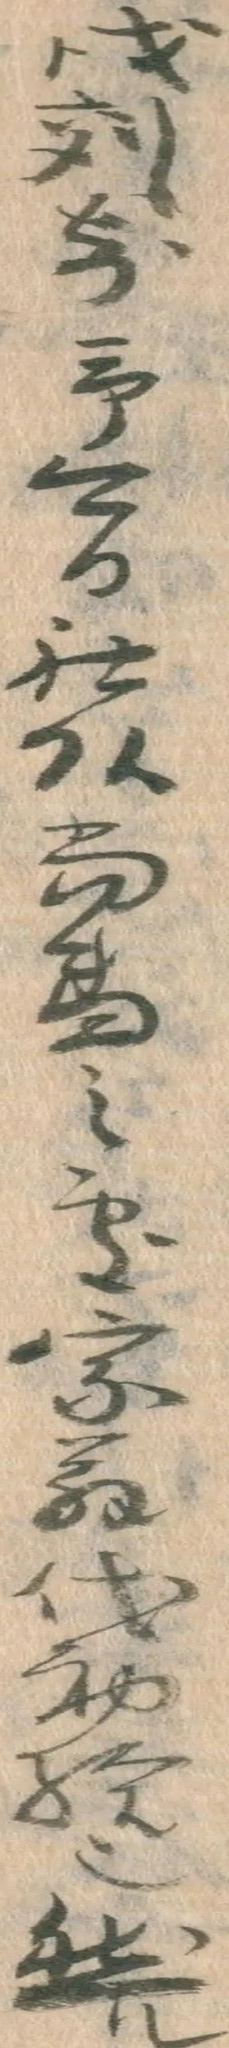戌刻前、予今日社頭當番之處、家翁代初続也、然ル
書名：賀茂社記録. 第63冊
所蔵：国立国会図書館 National Diet Library, JAPAN
